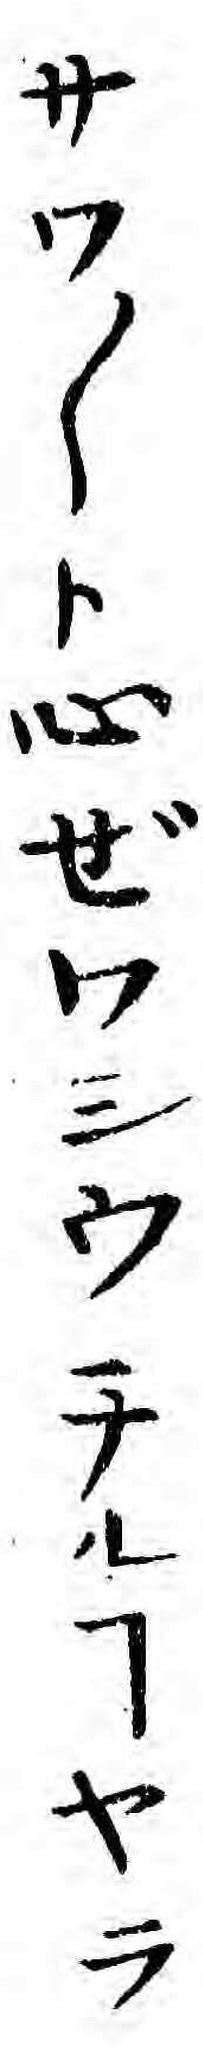サワ〳〵ト心ぜワシウチルコトヤラ
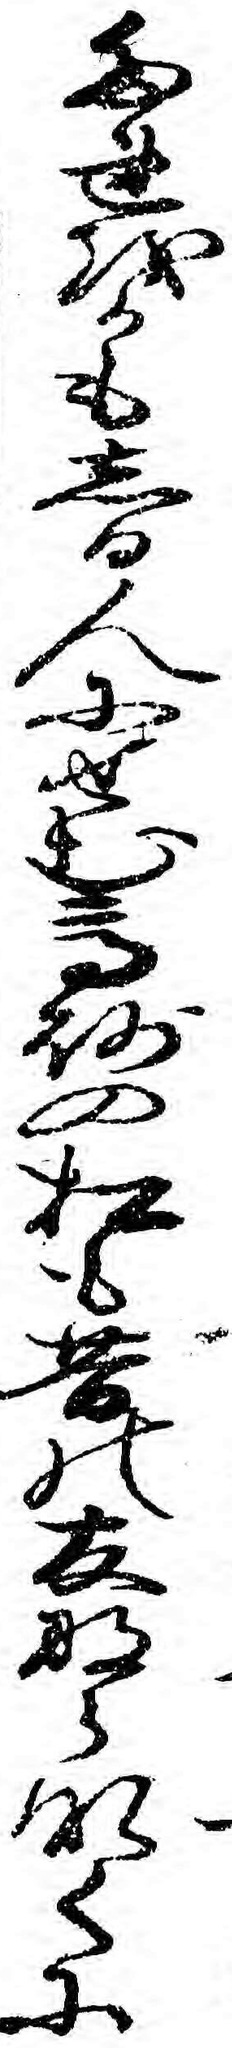たれをかもしる人にせむ高砂の松も昔の友ならなくに
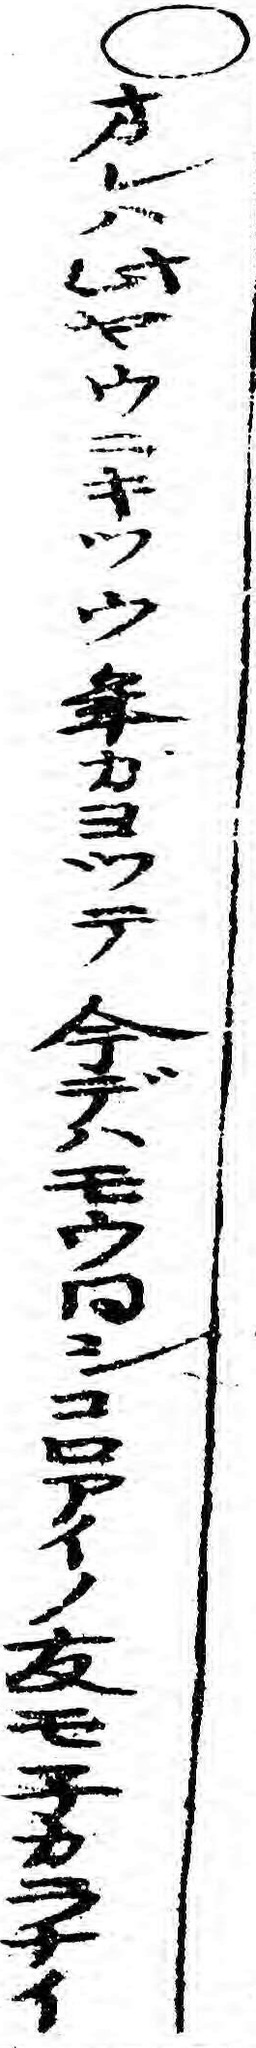○オレハ此ヤウニキツウ年ガヨツテ今デハモウ同シコロアイノ友モ子カラナイ
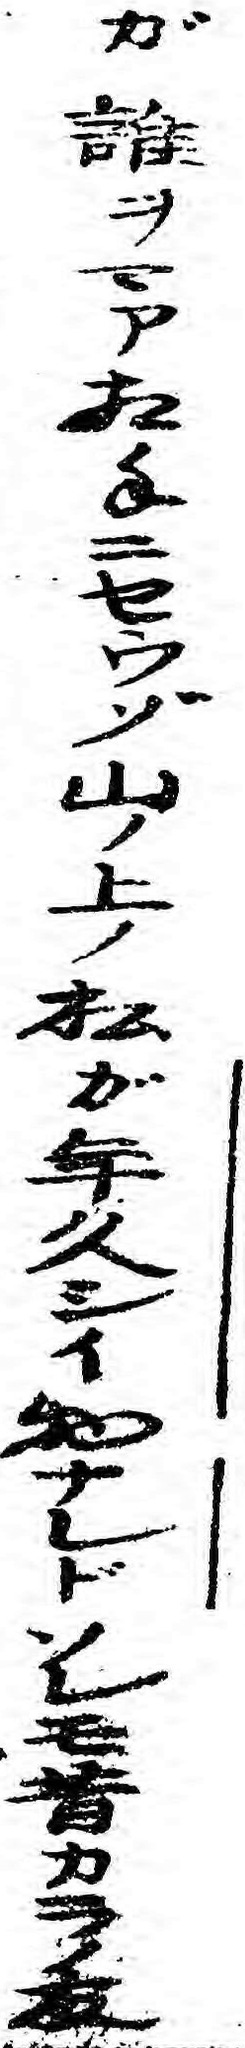ガ誰ヲマア相手ニセウゾ山ノ上ノ松ガ年久シイ物ナレドソレモ昔カラノ友
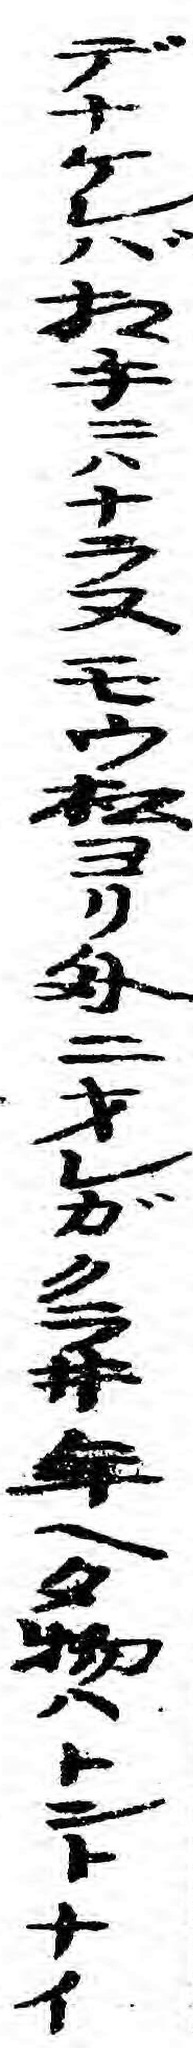デナケレバ相手ニハナラヌモウ松ヨリ外ニオレガクラヰ年ヘタ物ハトントナイ
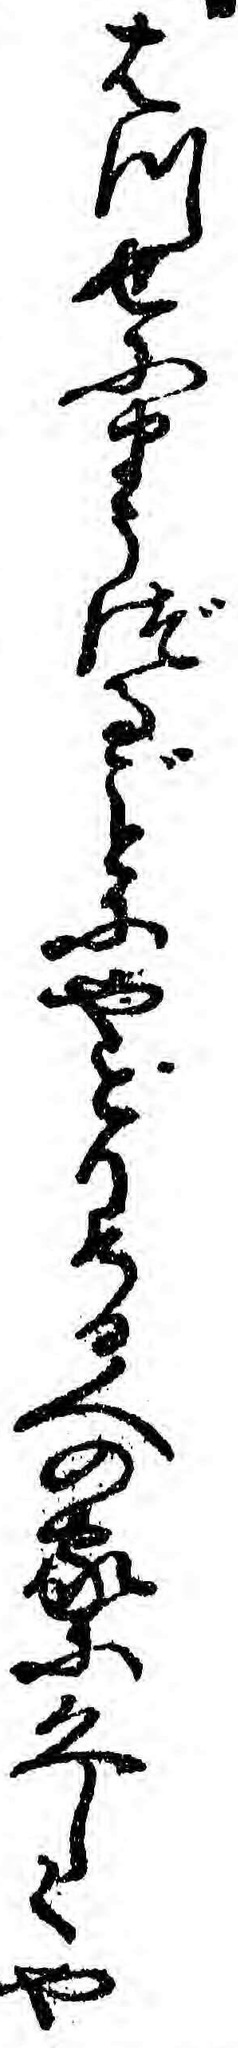古今集春はつせにまうづるごとにやどりける人の家に久しくや
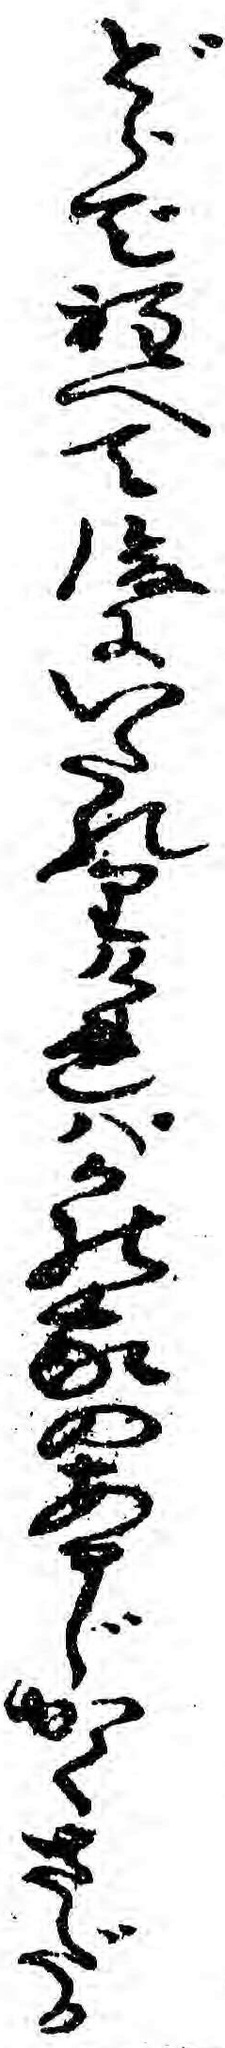どらで程へて後にいたれりければかの家のあるじかくさだか
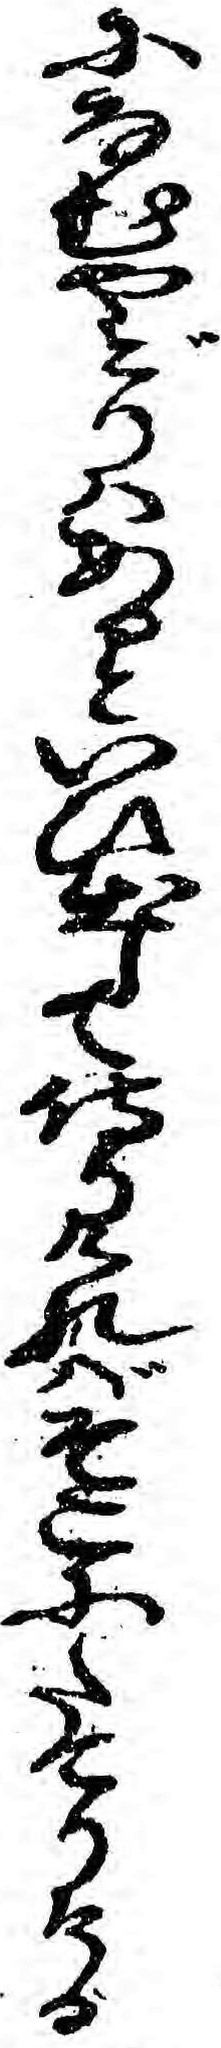になむやどりはあるといひ出して侍りければそこにたてりける
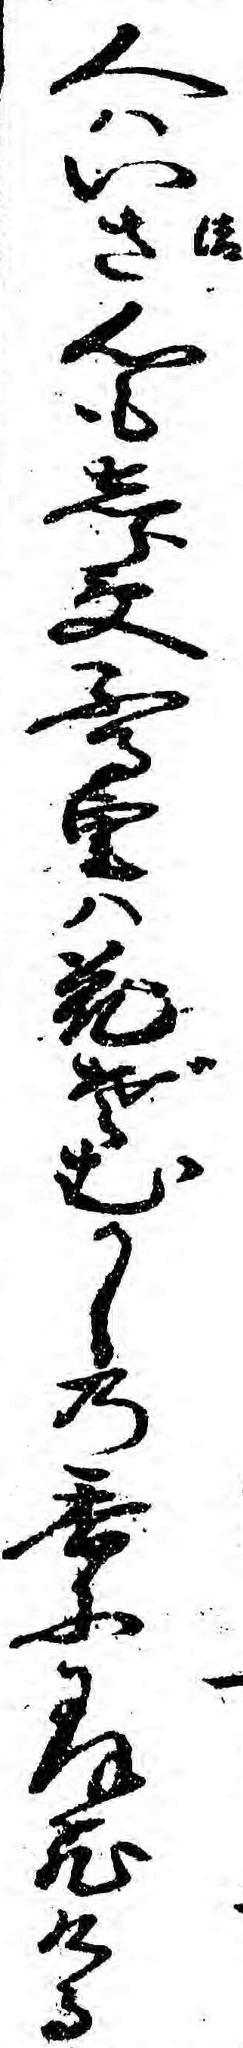人はいさ心もしらずふる里は花ぞむかしの香ににほひける

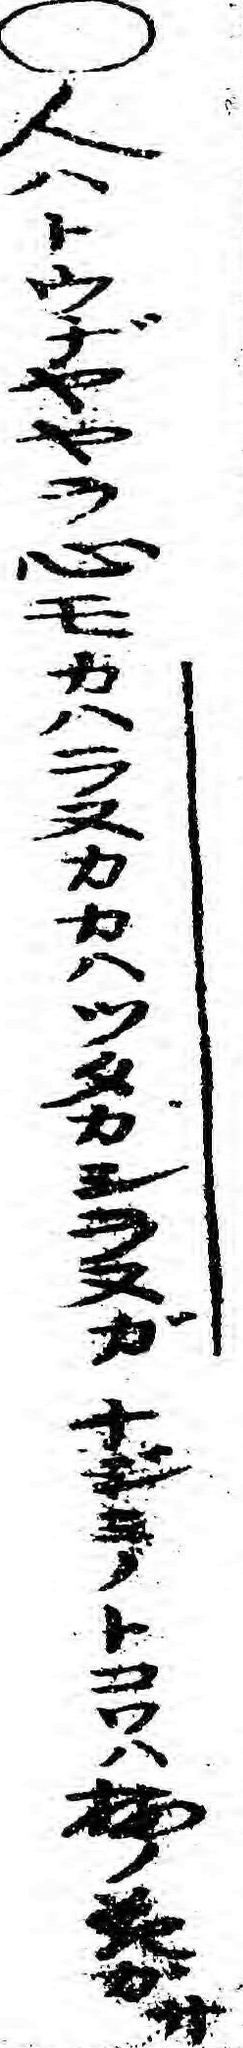○人ハトウヂヤヤラ心モカハラヌカカハツタカシラヌガナジミノトコワハ梅ノ花ガ
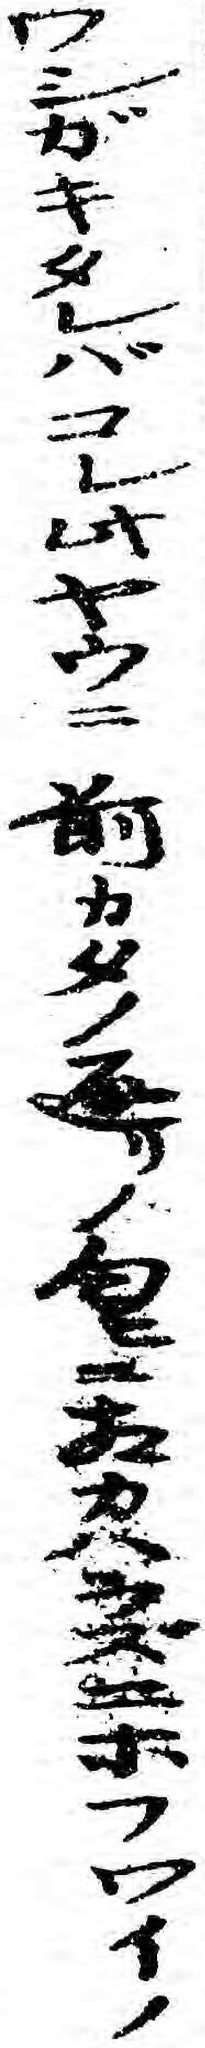ワシガキタレバコレ此ヤウニ前カタノ通リノ匂ヒニ相カハラズニホフワイノ
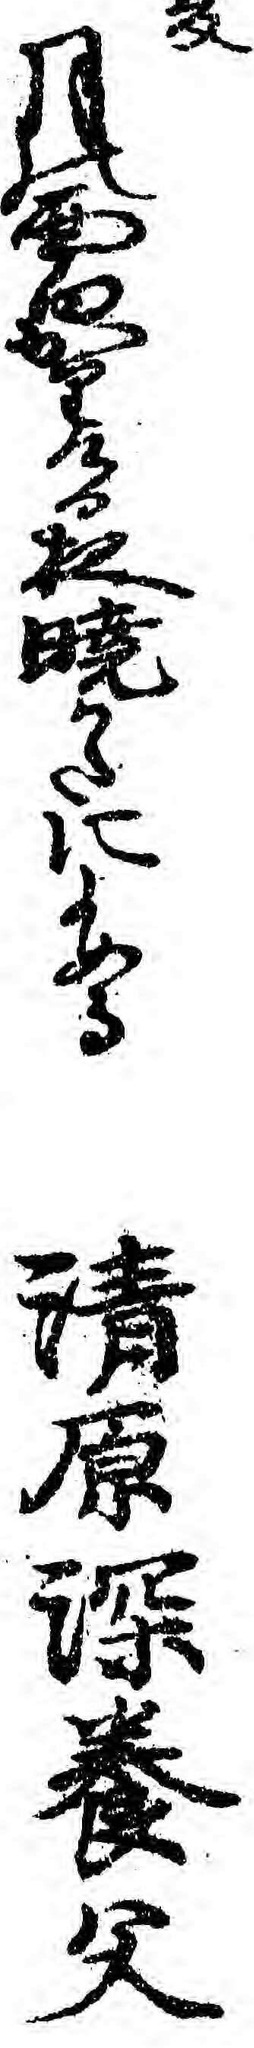古今集夏月の面白かりける夜暁かたによめる清原深養父
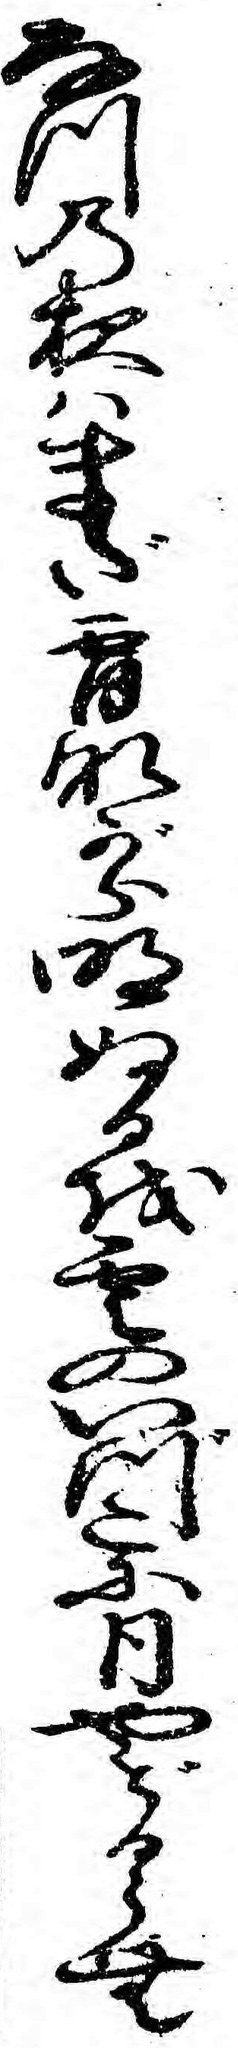なつの夜はまだ宵ながら明ぬるを雲のいづこに月やどるらむ
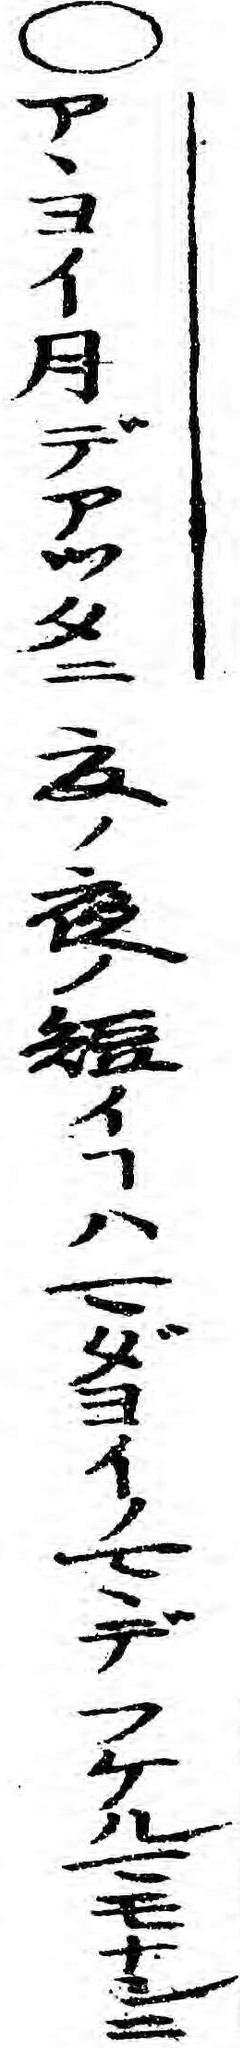○アヽヨイ月デアツタニ夏ノ夜ノ短イコトハマダヨイノマヽデフケルマモナシニ
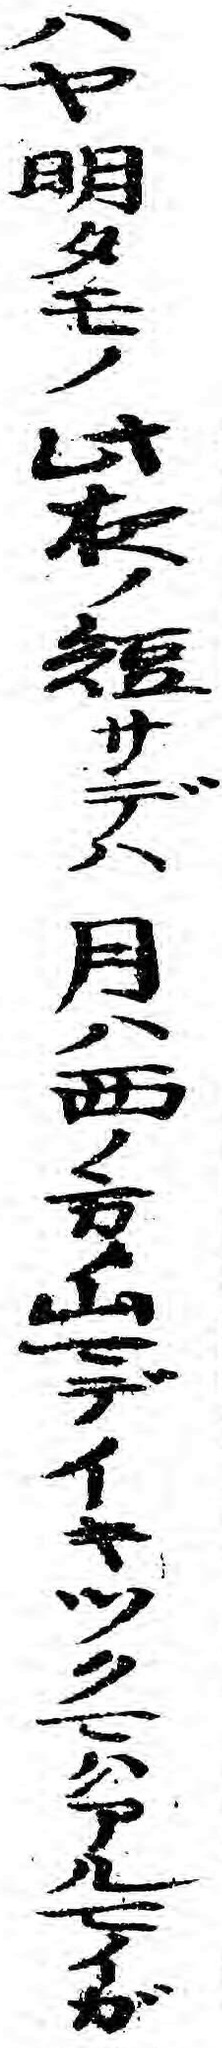ハヤ明タモノ此夜ノ短サデハ月ハ西ノ方ノ山マデイキツクマハアルマイガ
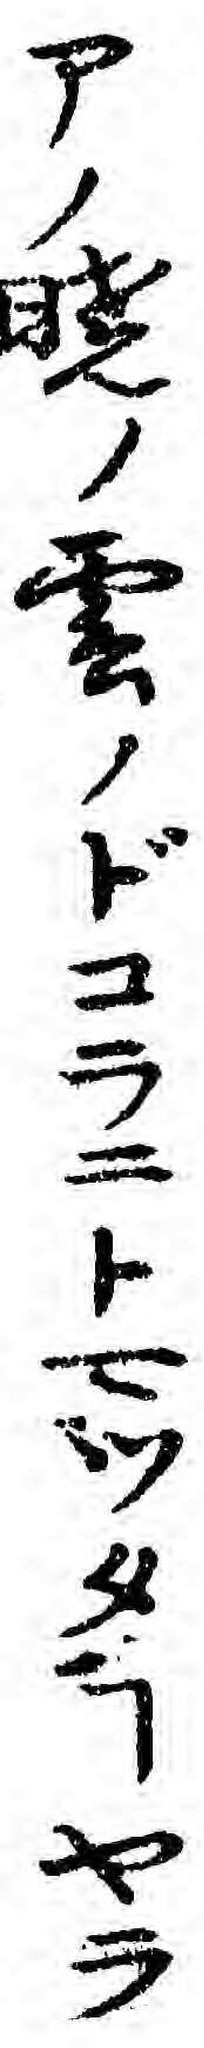アノ暁ノ雲ノドコラニトマツタコトヤラ
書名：百人一首／小倉の山ふみ
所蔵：国文学研究資料館
